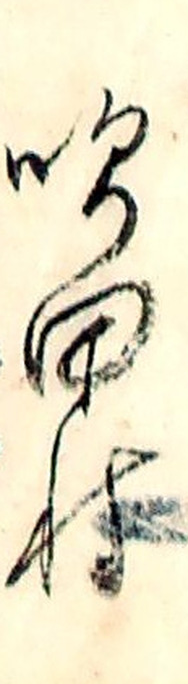吹田村
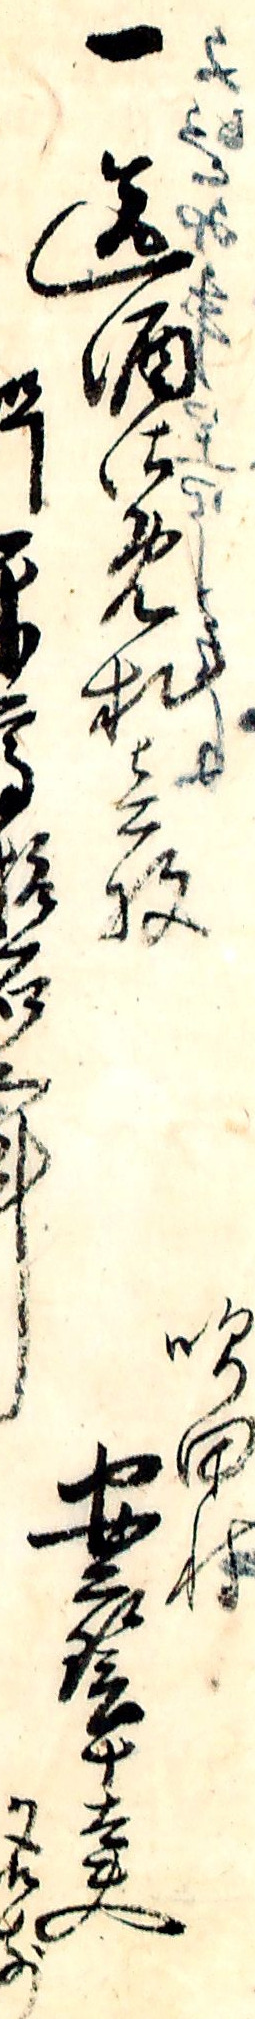一造酒御免札一枚安芸十太夫
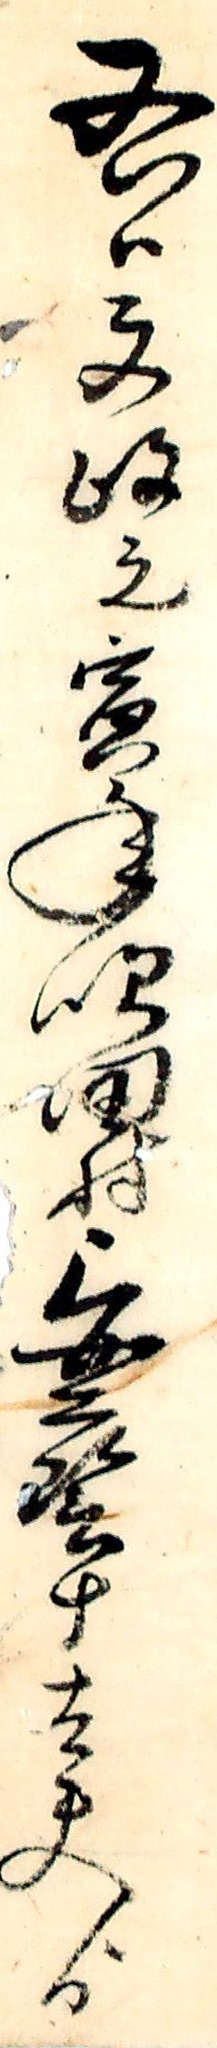右は文政元寅年吹田村安芸十太夫ゟ
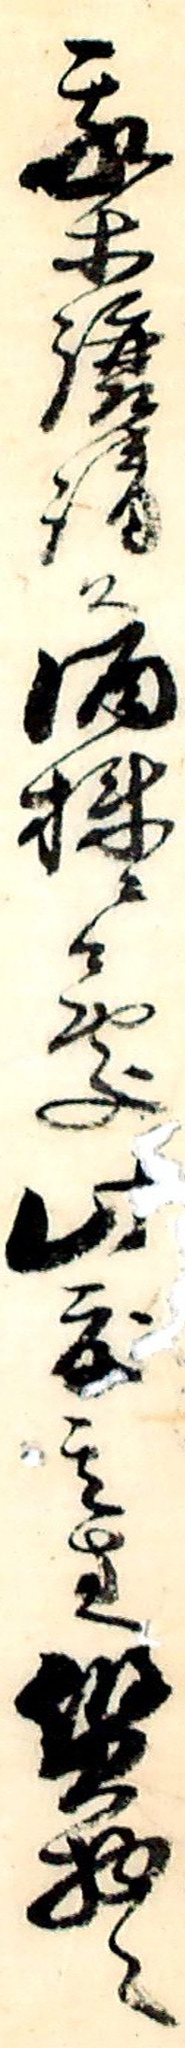我等譲請候酒株に候処此度其方へ質物に
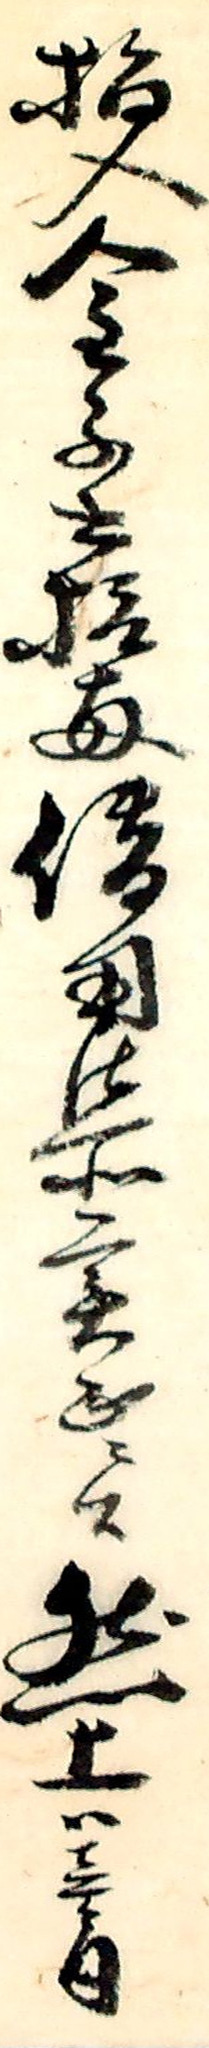指入金子六拾両借用仕所実正に候然上は壱月
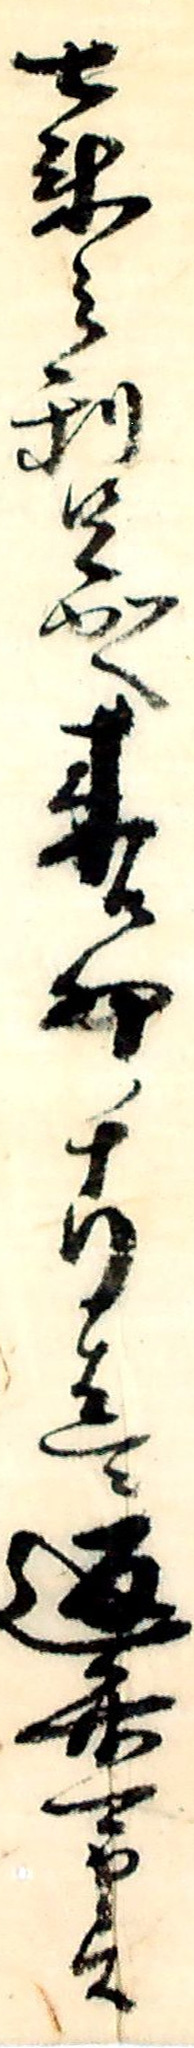七朱之利足加へ来る卯ノ十月迄に返弁可申候
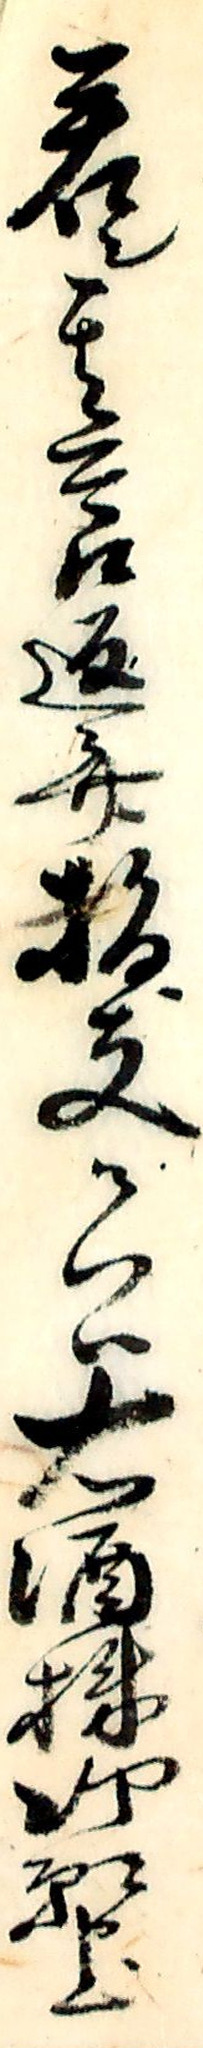若し其節返弁指支候へは右酒株御願申上
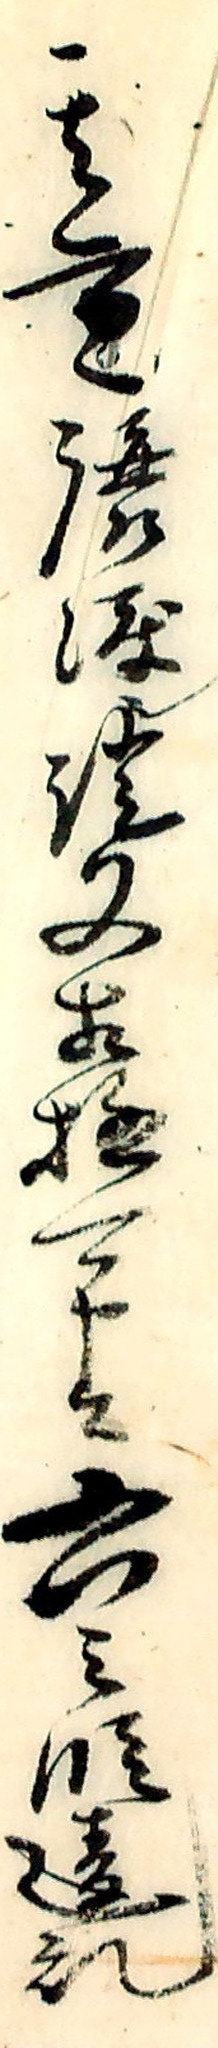其方へ譲渡し証文相極可申候右之段違乱
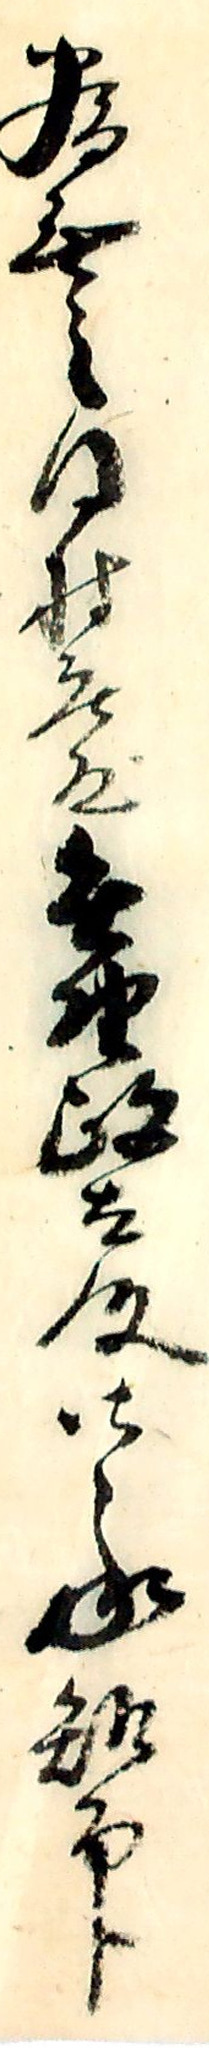為無之同村庄屋矢野政太殿御承知印
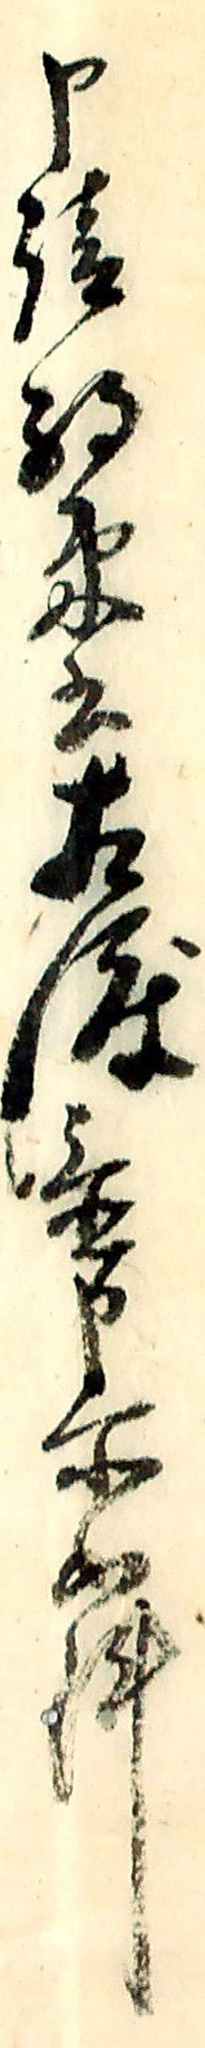申請約束書相渡置申所如件
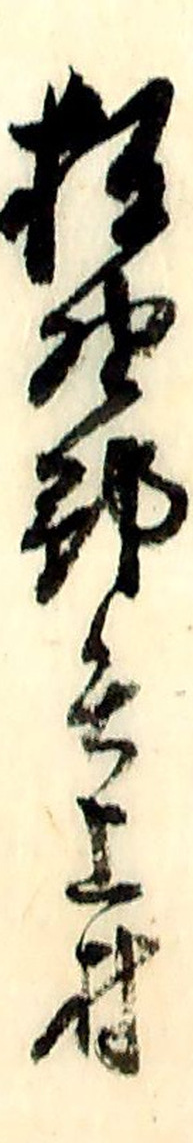板野郡矢上村
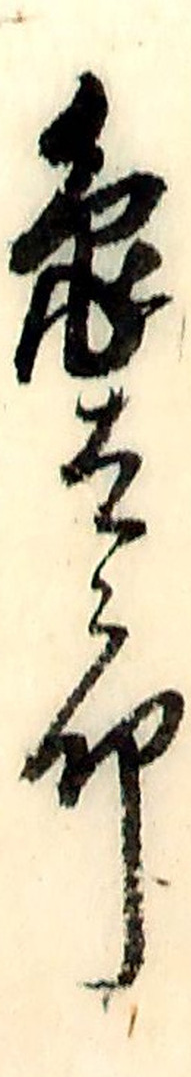亀太郎
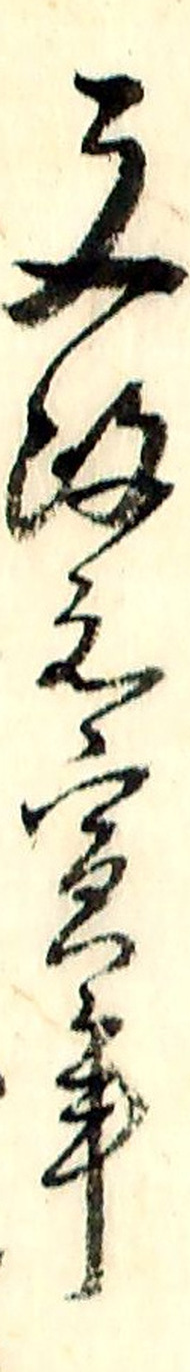文政元寅年
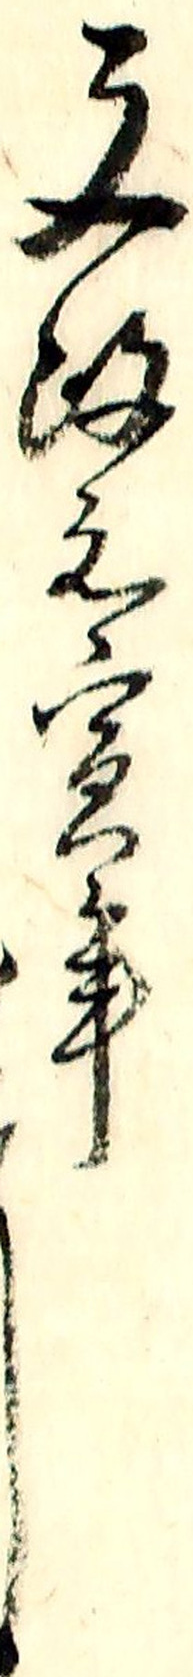文政元寅年
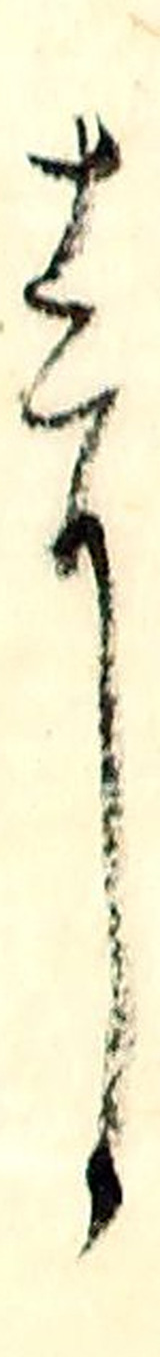十二月
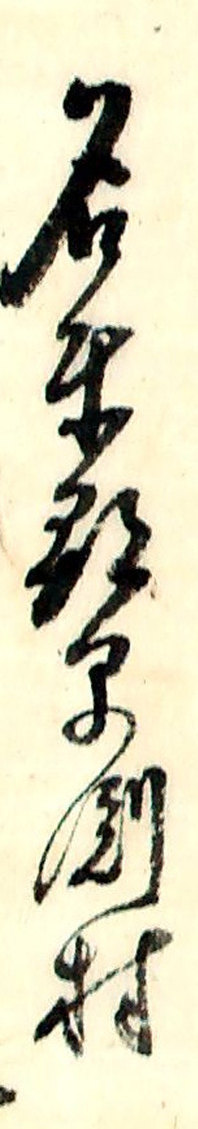名東郡早淵村
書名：諸御願書控(後藤氏壱番）
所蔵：鳴門教育大学 Naruto University of Education
